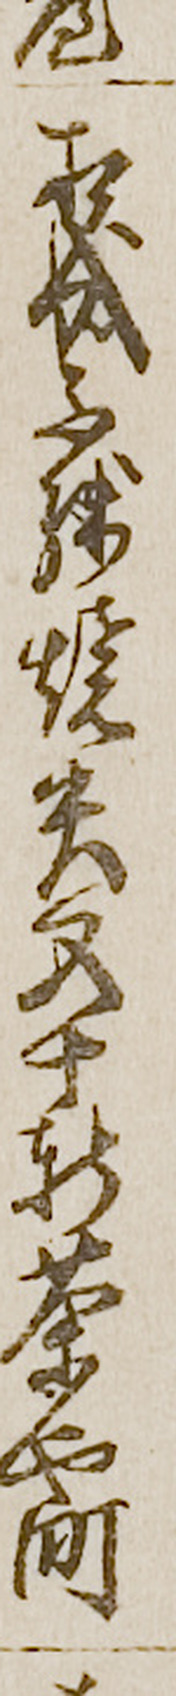相成不残焼失五十軒新茶や町
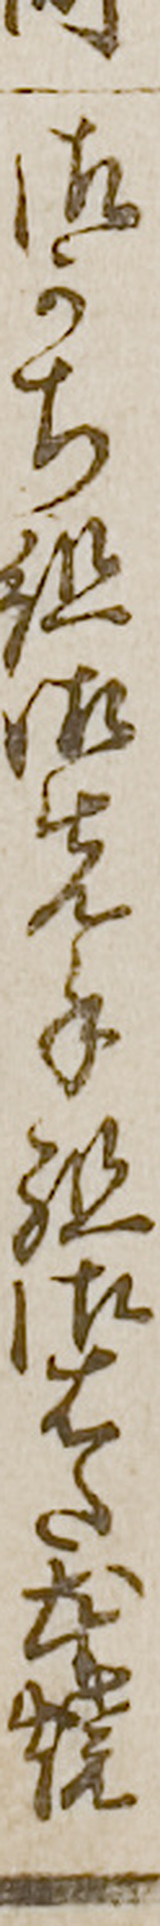御かち組御先手組御はた本焼
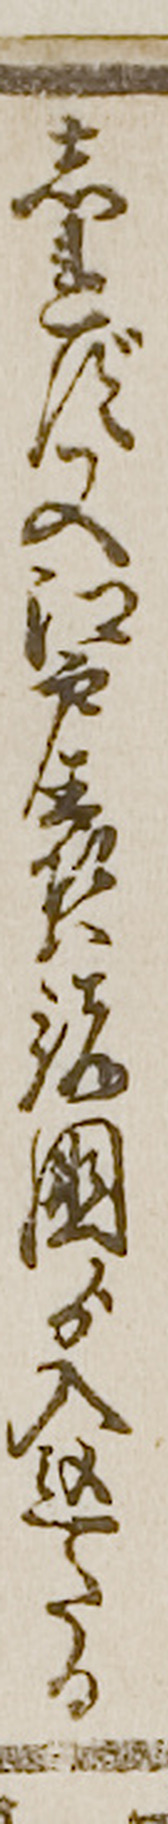しれず又江戸表は諸国ゟ入込たる
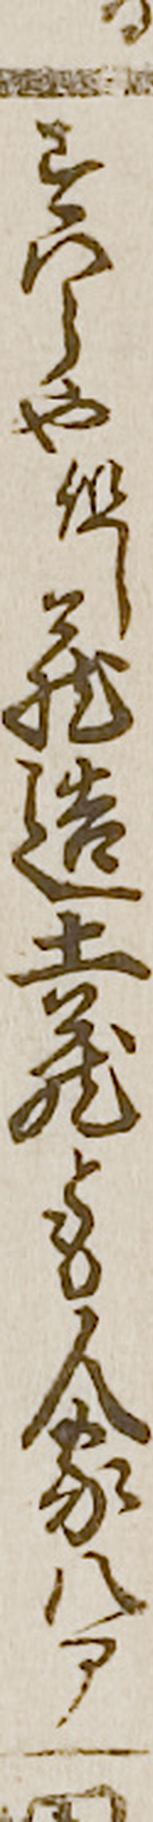すはら屋但し蔵造土蔵とも人家八部
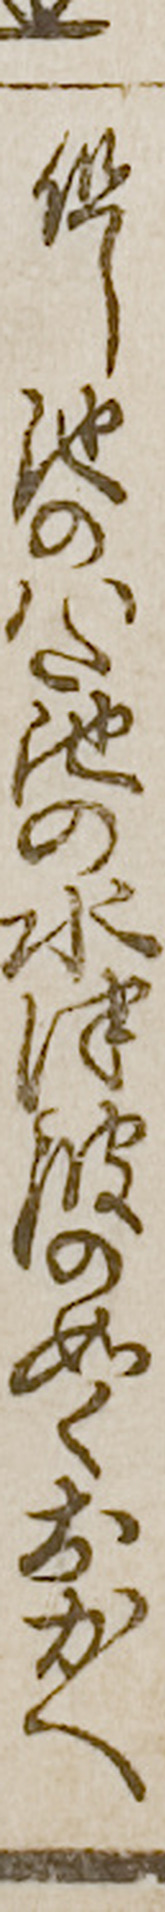但し池のはた池の水津波の如くおかへ
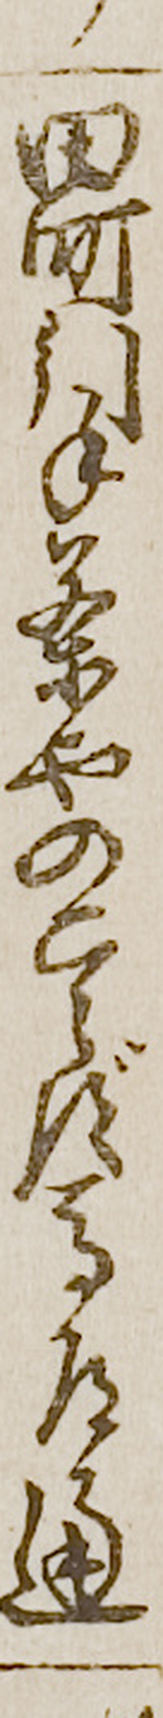田町引手茶やのこらず馬道通
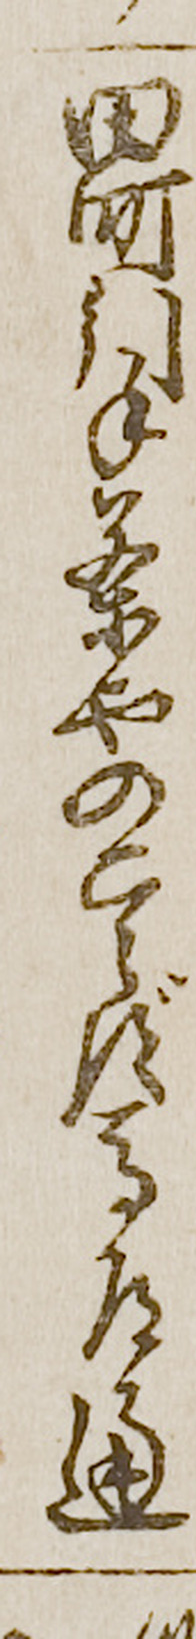田町引手茶やのこらず馬道通
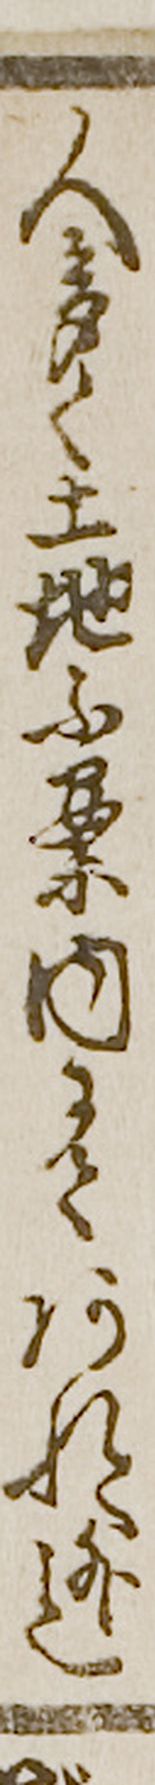人多く土地不案内にて何れへ逃
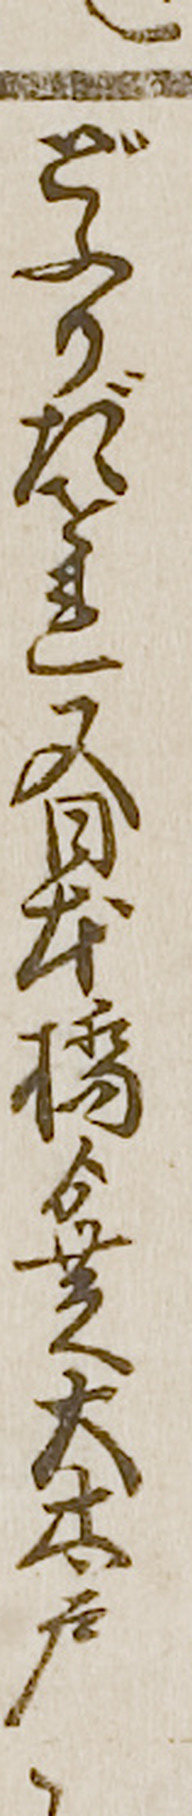どふりだをれ又日本橋ゟ芝大木戸
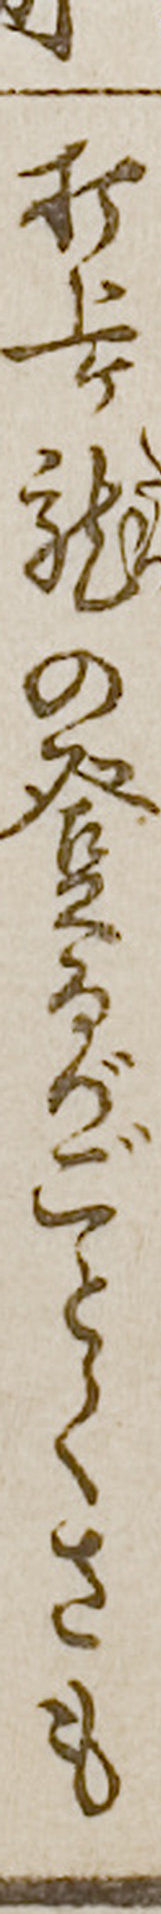打上ヶ龍の登るがごとくさも
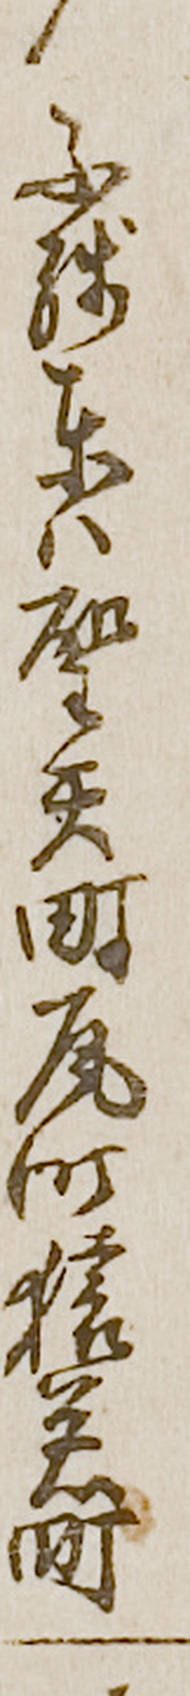不残東は聖天町瓦町猿若町
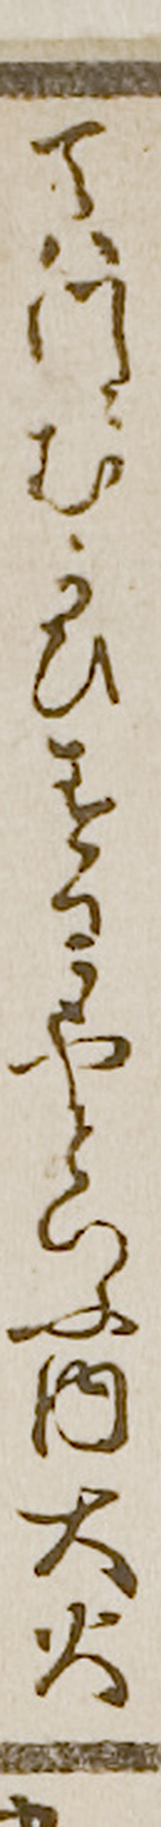ては門にむかひすわやといふ内大火
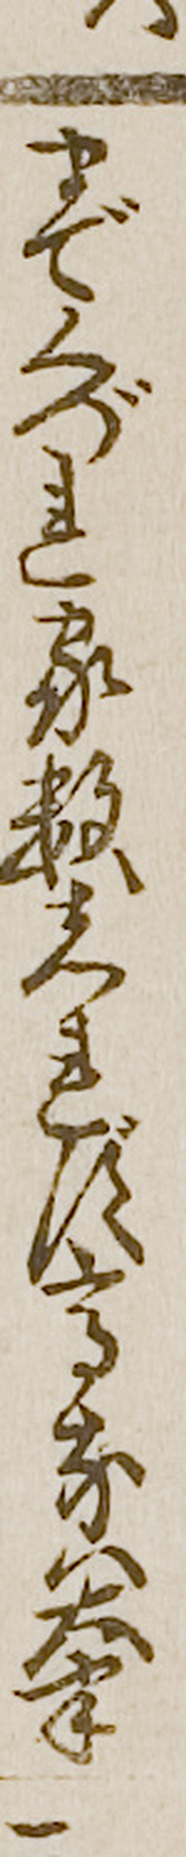までくづれ家数しれず高なは大半
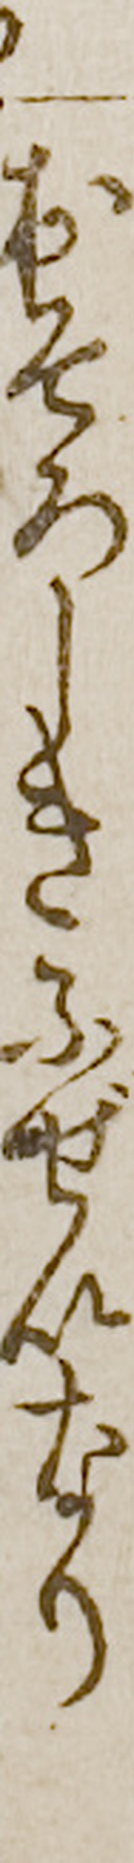おそろしきふぜいなり
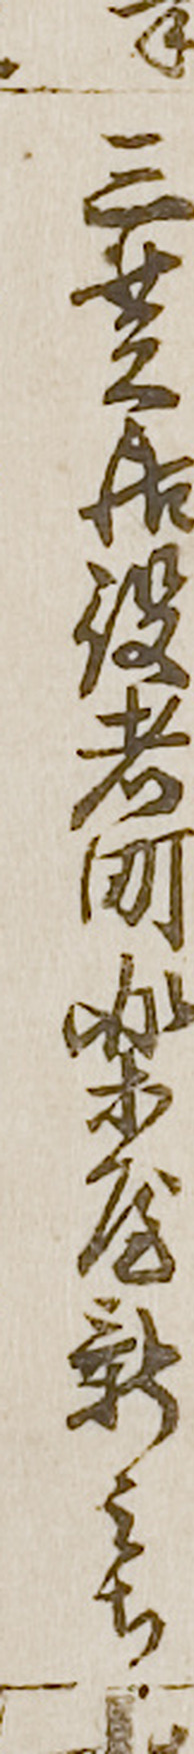三芝居役者町楽屋新みち
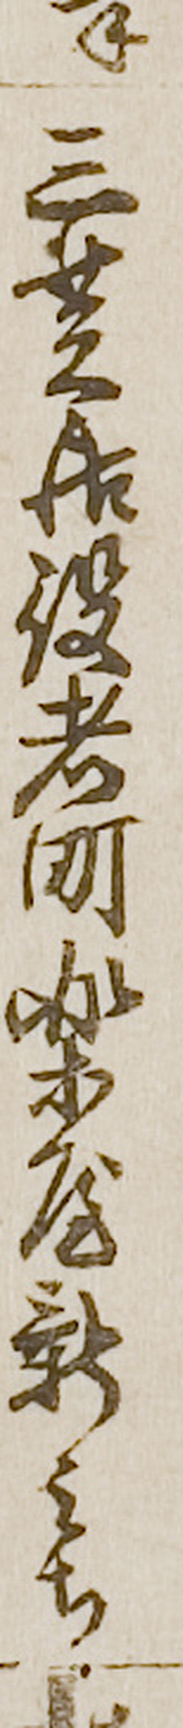三芝居役者町楽屋新みち
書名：東都珍事実録咄
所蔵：東京大学総合図書館 General Library in the University of Tokyo, JAPAN
